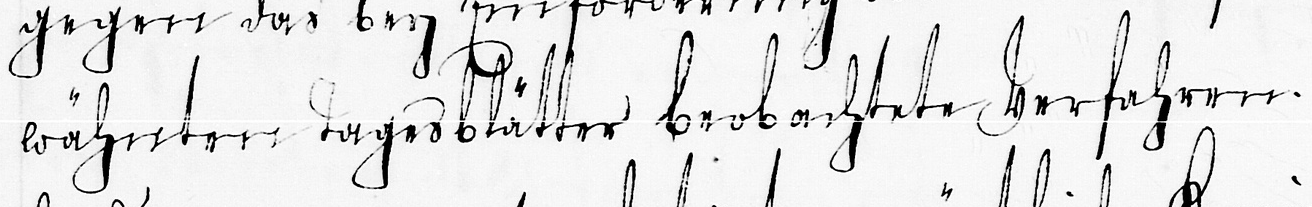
wähnten Tagesblätter beobachtete Verfahren.
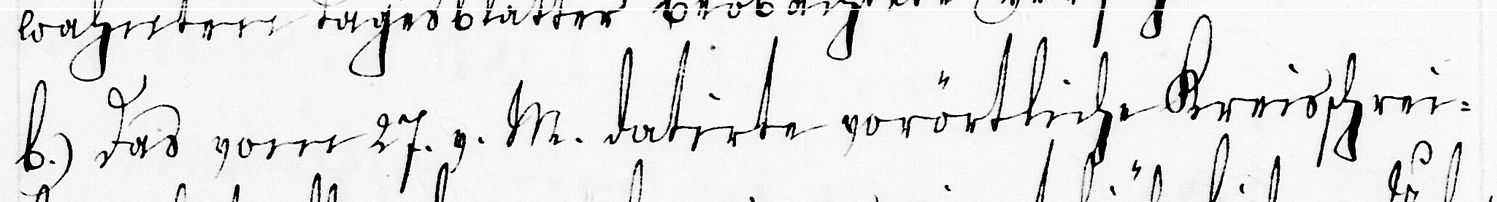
b.) Das vom 27. v. M. datirte vorörtliche Kreisschrei¬
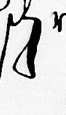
l,
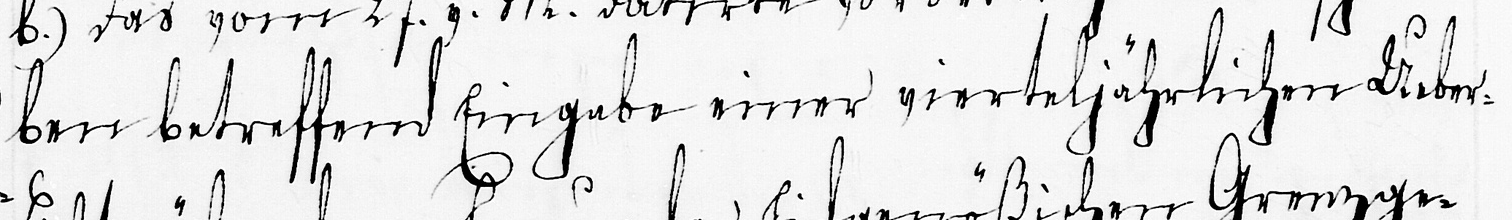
ben betreffend Eingabe einer vierteljährlichen Ueber¬
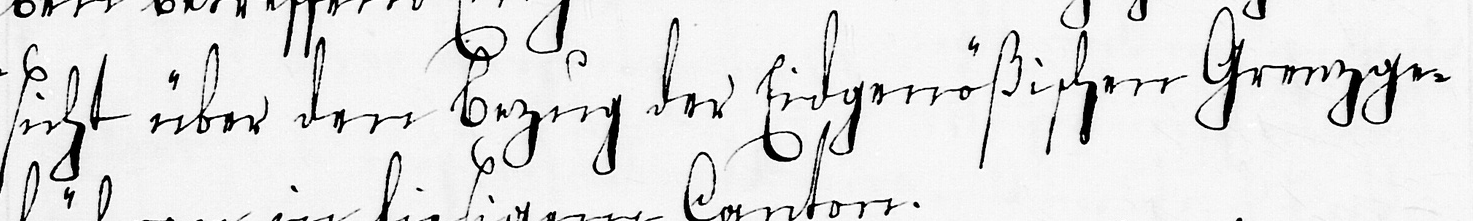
sicht über den Bezug der Eidgenößischen Grenzge¬
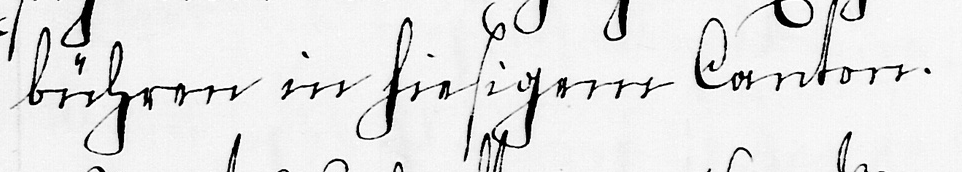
bühren in hiesigem Canton.
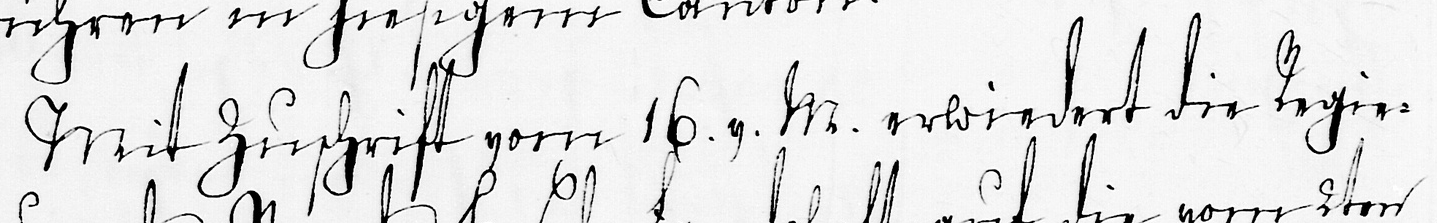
Mit Zuschrift vom 16. v. M. erwiedert die Regie¬
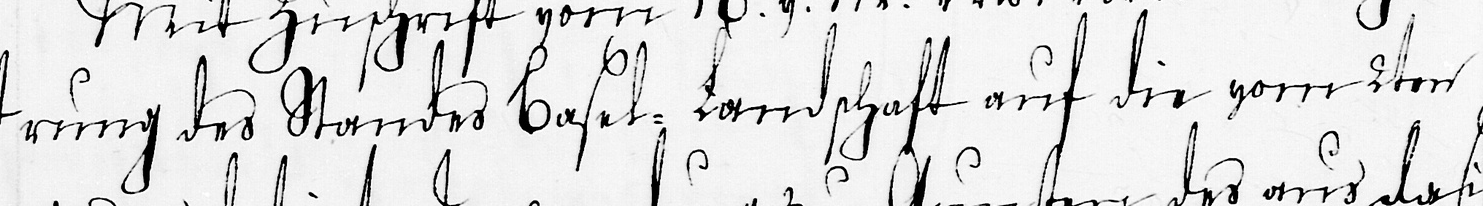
rung des Standes Basel-Landschaft auf die vom 2ten
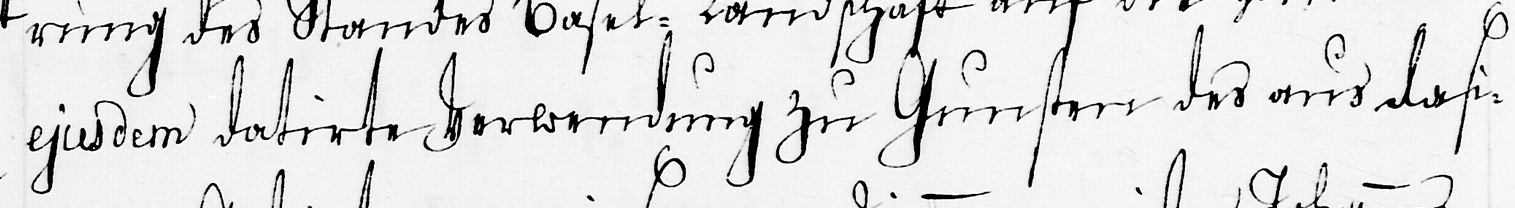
ejusdem datirte Verwendung zu Gunsten des aus dasi¬
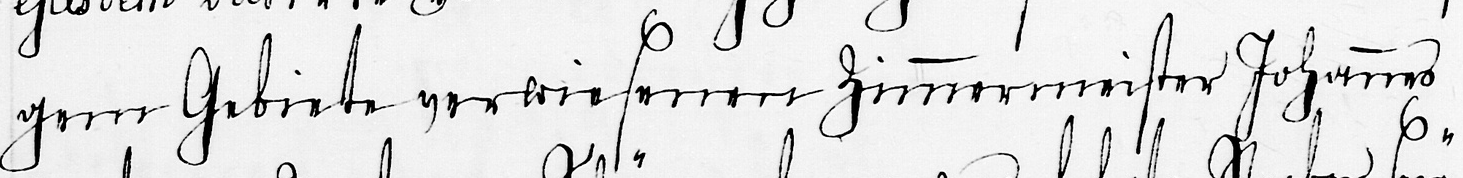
gem Gebiete verwiesenen Zimmermeister Johannes
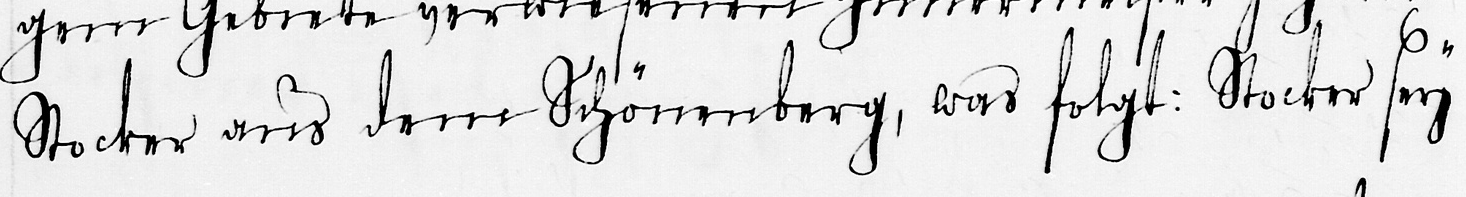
Stocker aus dem Schönenberg, was folgt: Stocker sey
